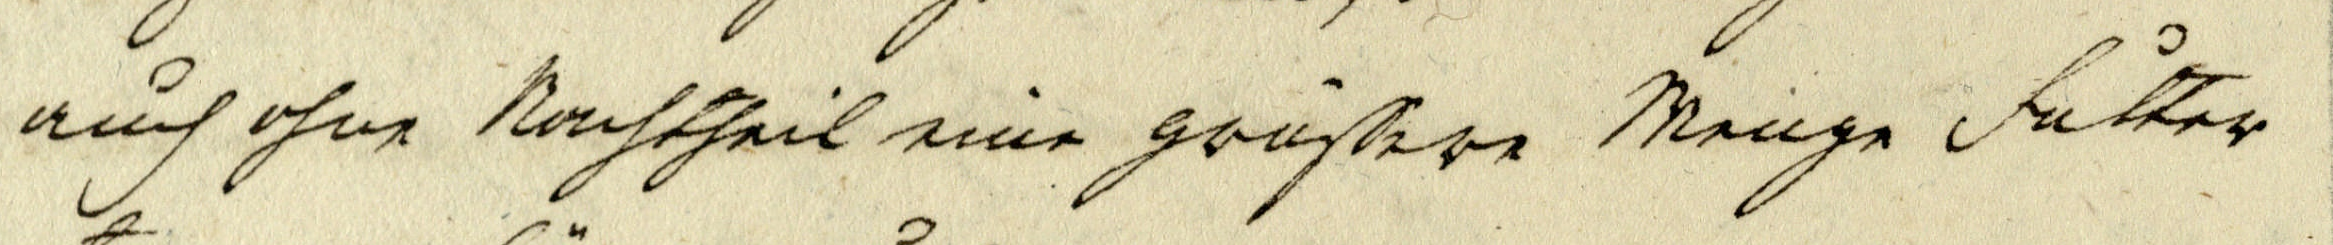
auch ohne Nachtheil eine grössere Menge Futter
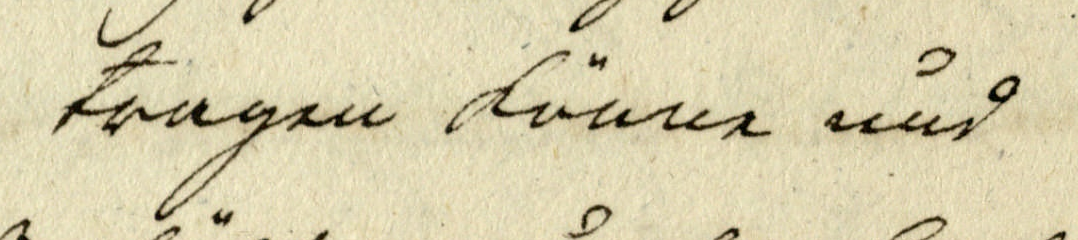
tragen könne und
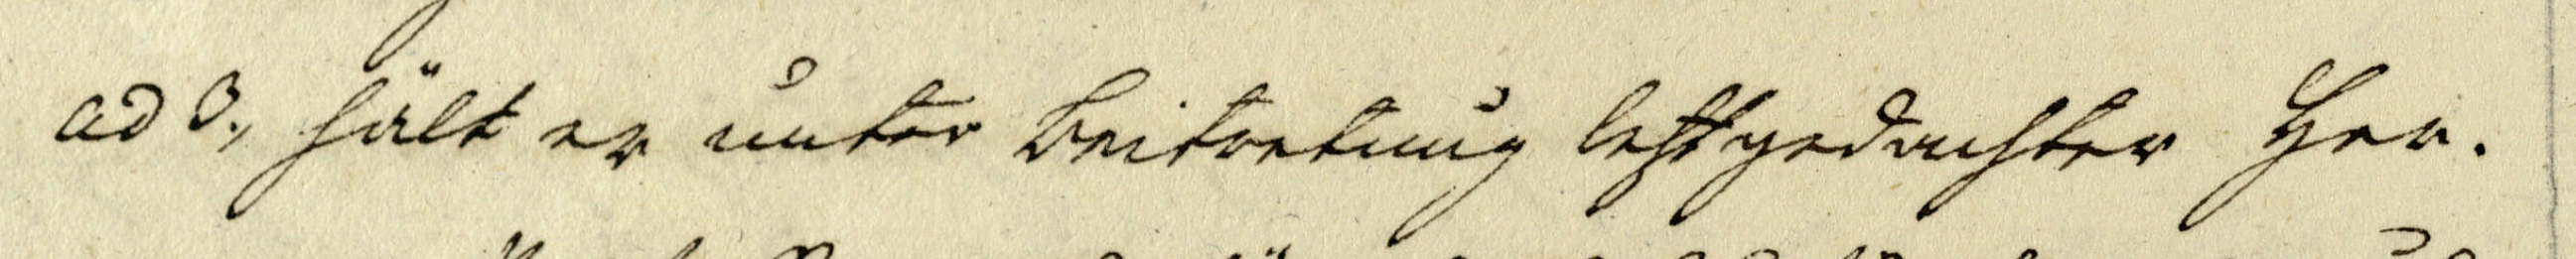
ad 3. hält er unter Beitretung letztgedachter Her¬
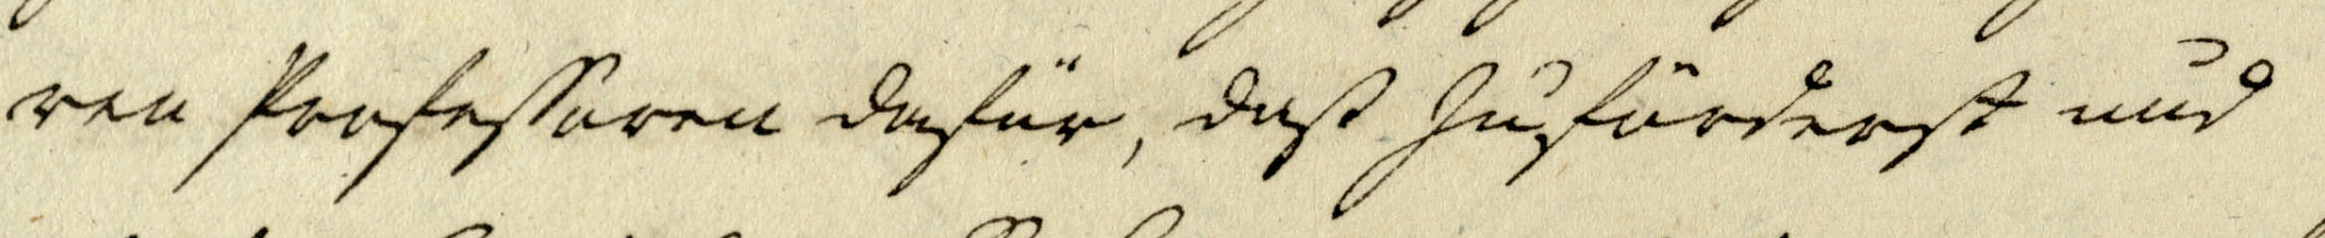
ren Professoren dafür, daß zuförderst und
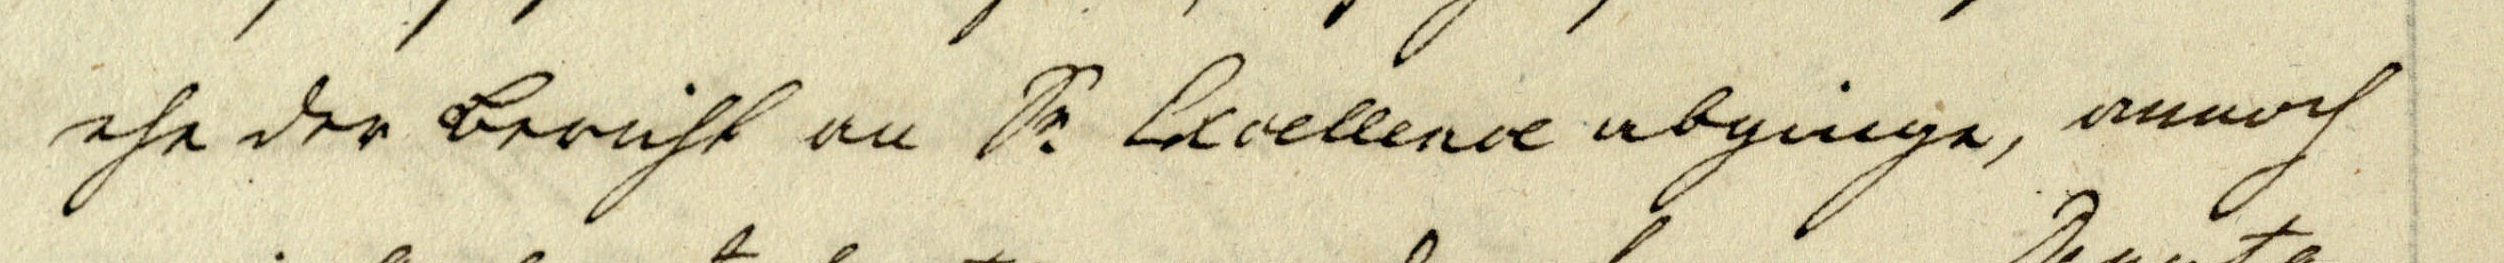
ehe der Bericht an Sr Excellence abginge, annoch
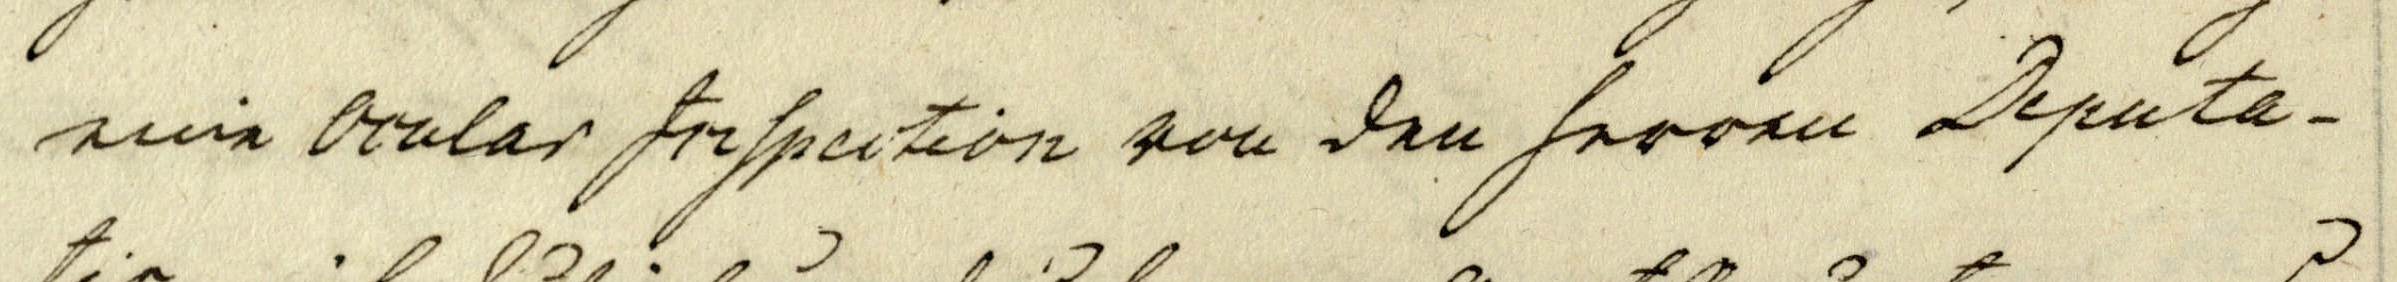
eine Ocular Inspection von den Herren Deputa¬
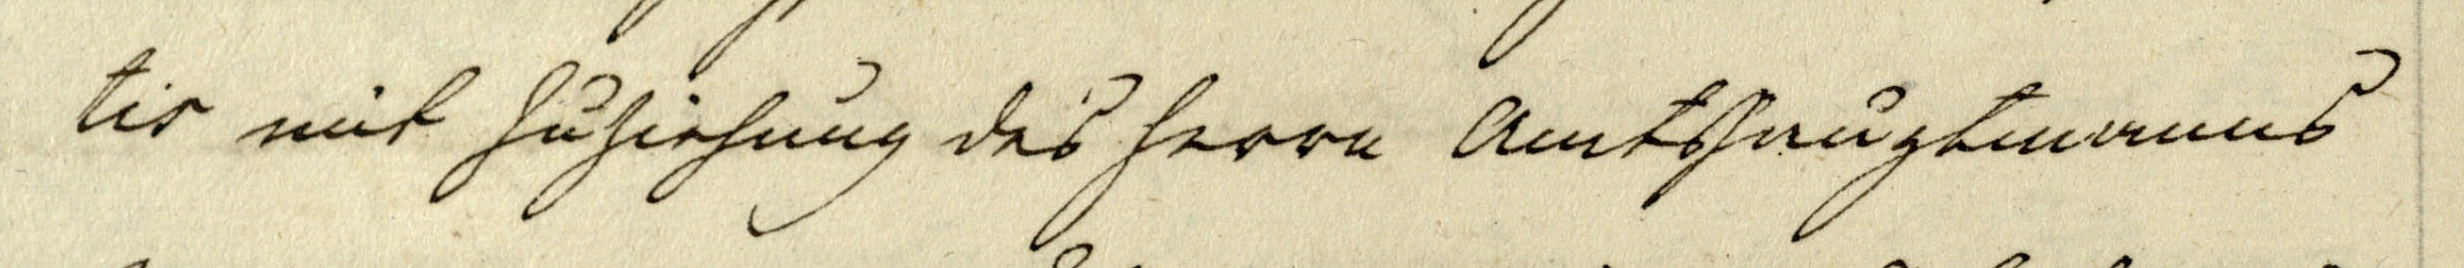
tis mit Zuziehung des Herrn Amtshauptmanns
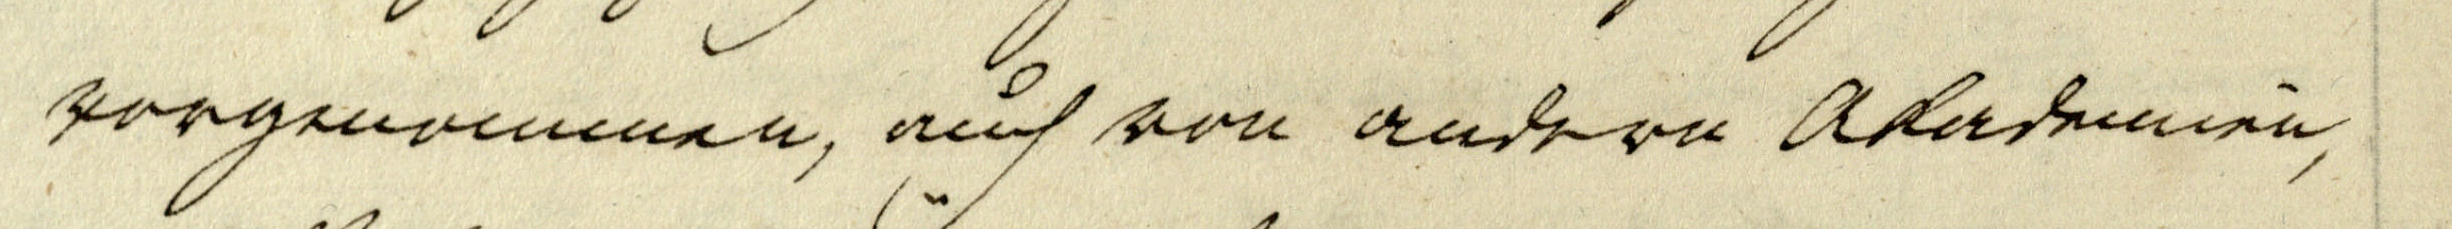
vorgenommen, auch von andere Akademien,
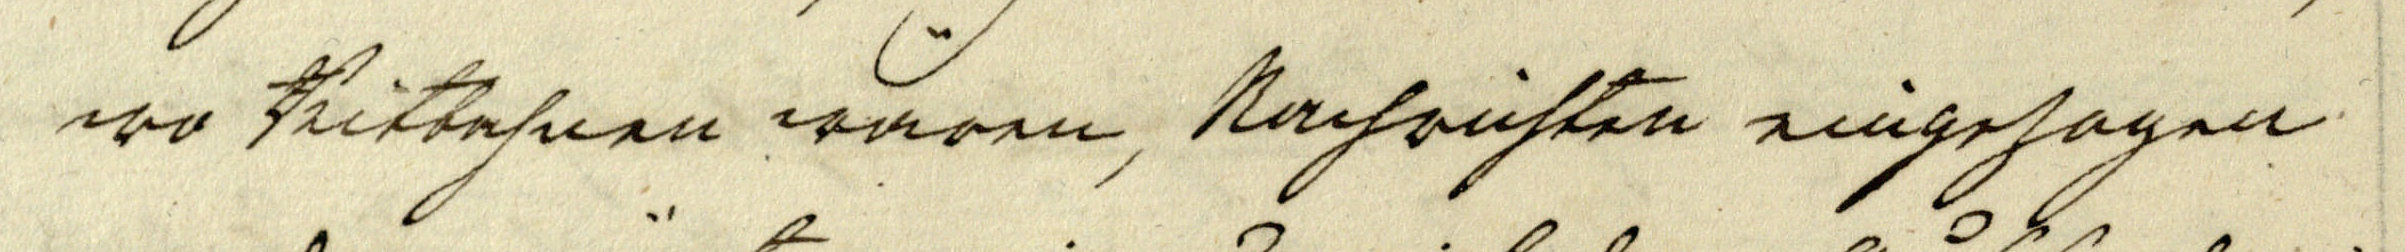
wo Reitbahnen wären, Nachrichten eingezogen
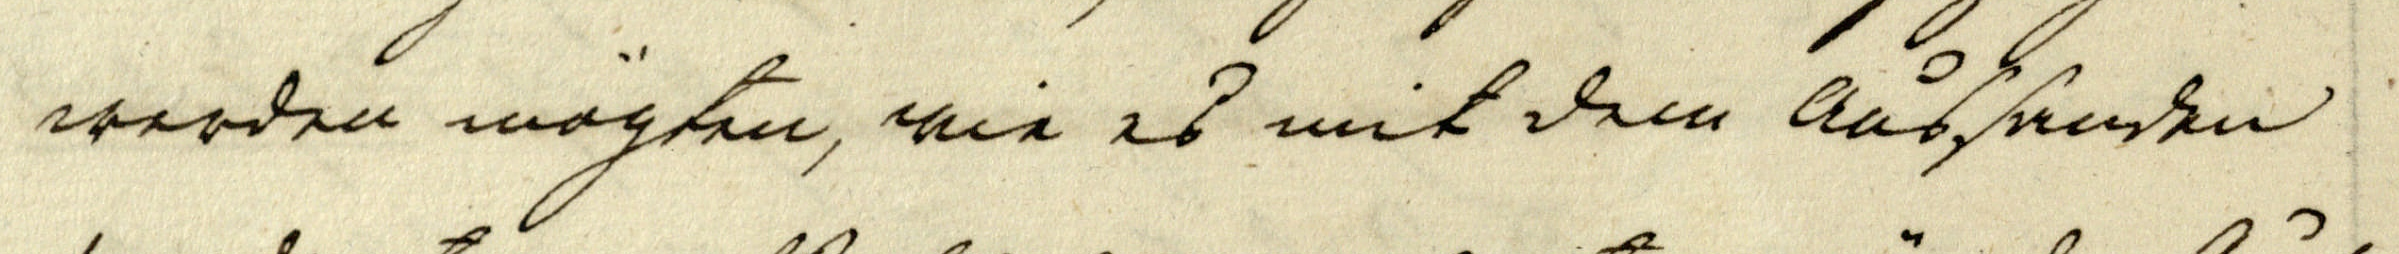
werden mögten, wie es mit dem Aussanden
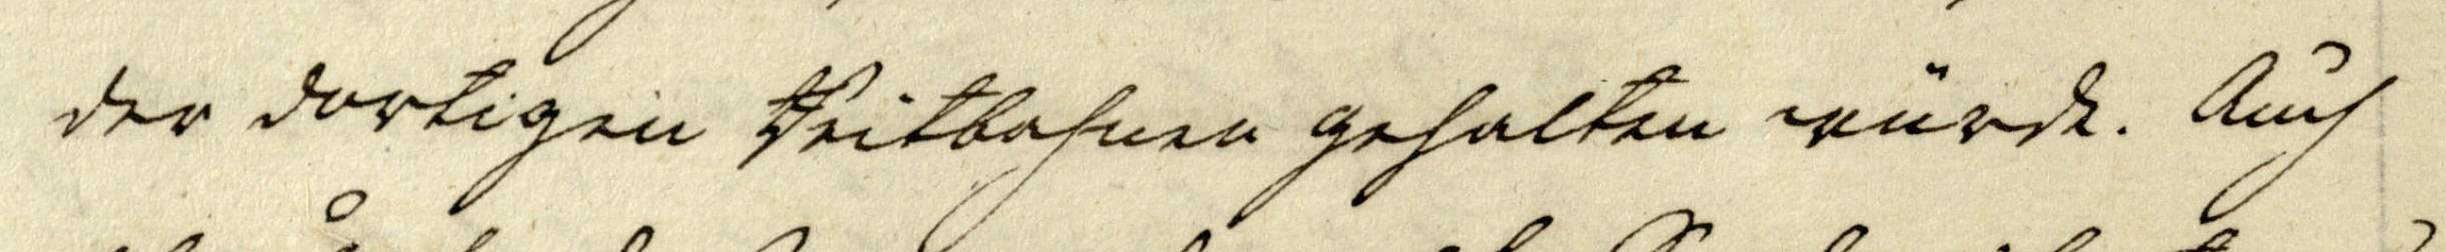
der dortigen Reitbahnen gehalten würde. Auch
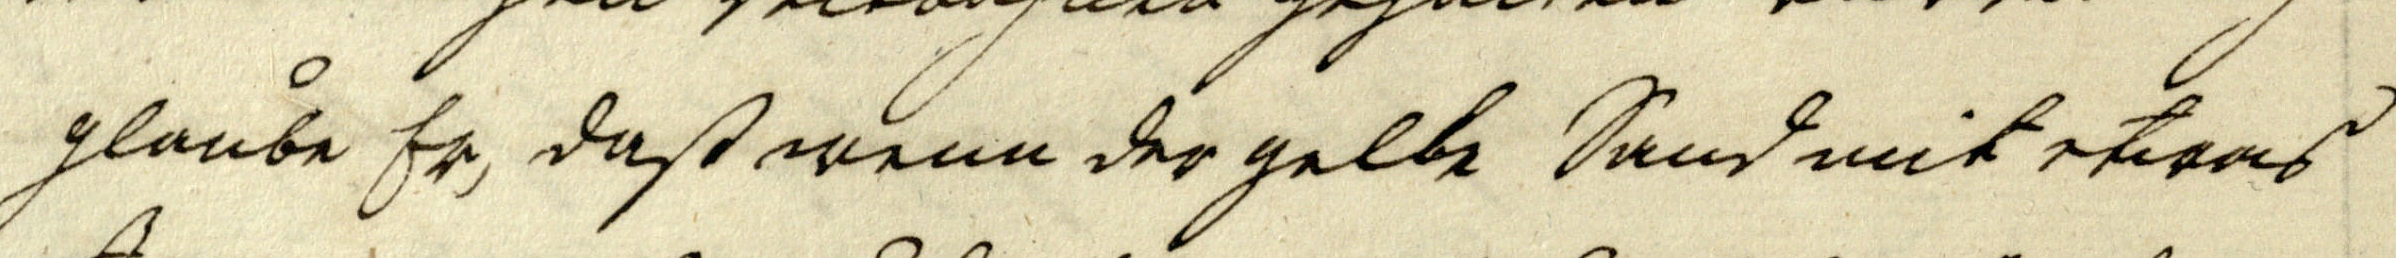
glaube Er, daß wenn der gelbe Sand mit etwas
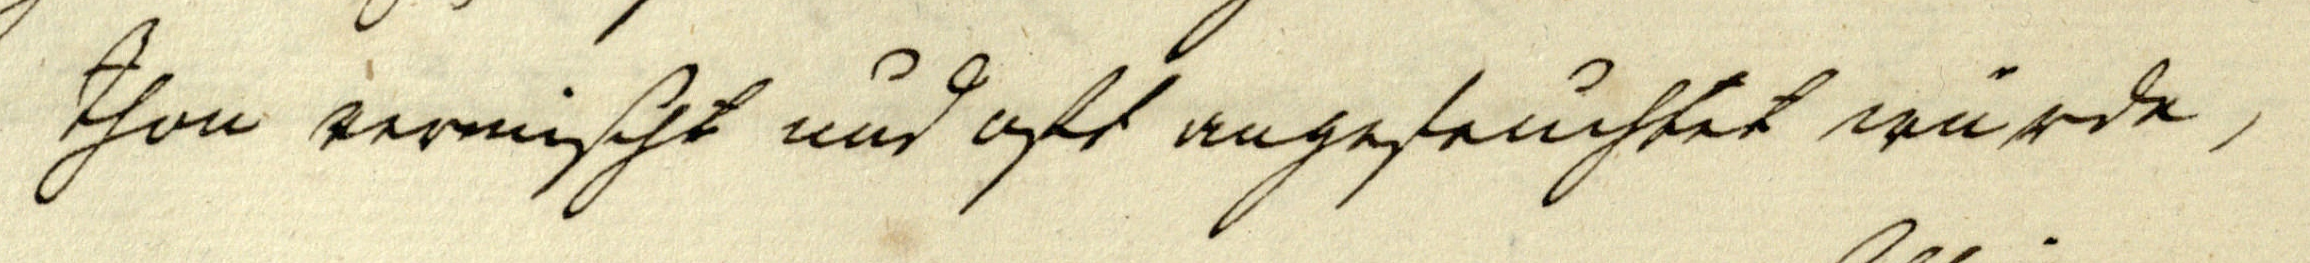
Thon vermischt und oft angefeuchtet würde,
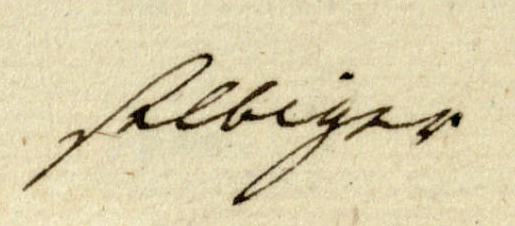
selbiger
